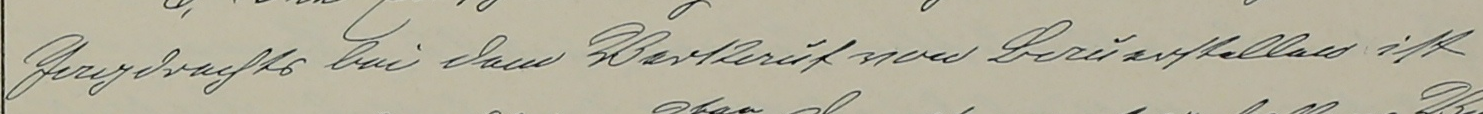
Jagdrechts bei dem Verkauf von Bauerstellen ist
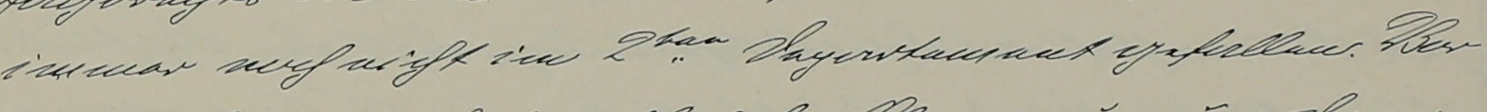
immer noch nicht im 2ten Departement gefallen. Vor
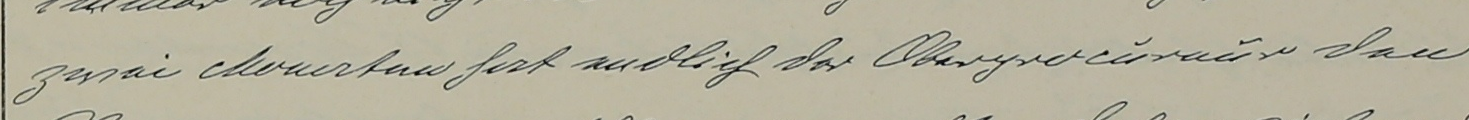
zwei Monaten hat endlich der Oberprocureur den
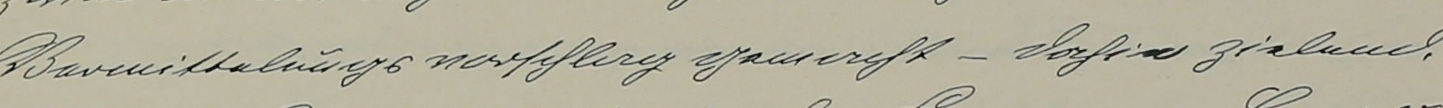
Vermittelungsvorschlag gemacht - dahin zielend,
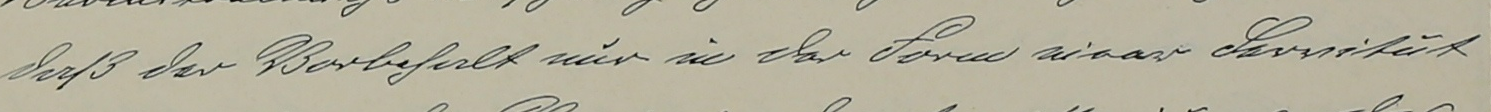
daß der Vorbehalt nur in der Form einer Servitut
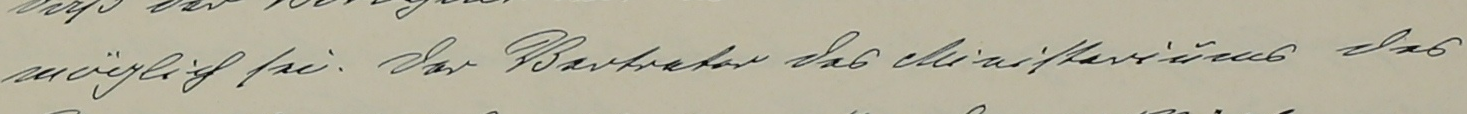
möglich sei. Der Vertreter des Ministeriums des
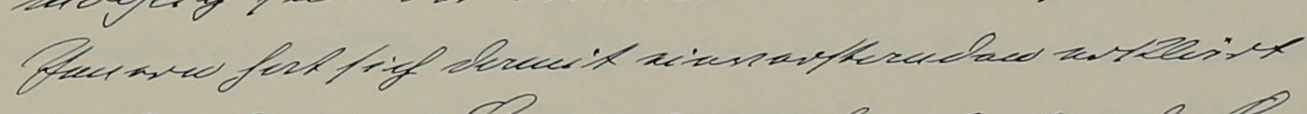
Innern hat sich damit einverstanden erklärt.
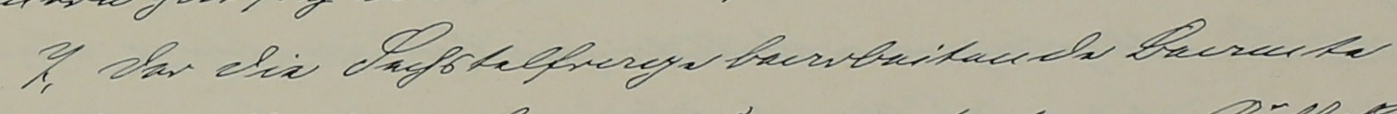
7. Der die Sechstelfrage bearbeitende Beamte
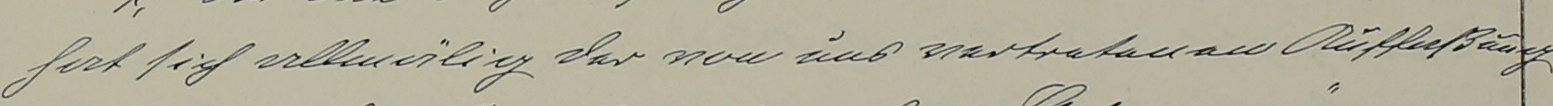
hat sich allmälig der von uns vertretenen Auffaßung
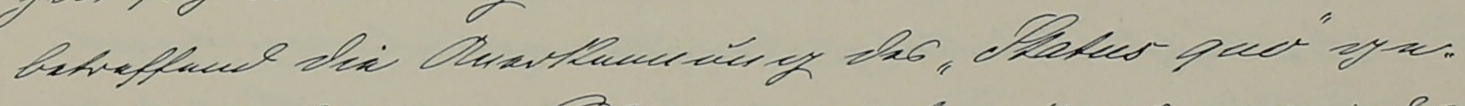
betreffend die Anerkennung des „Status quo“ ge-
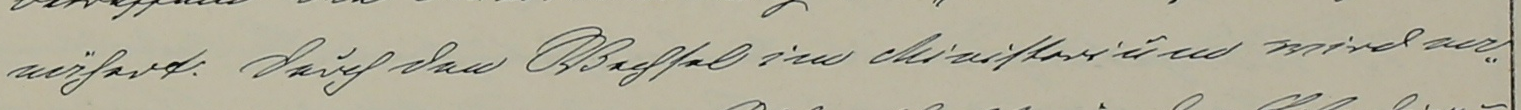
nähert. Durch den Wechsel im Ministerium wird na-
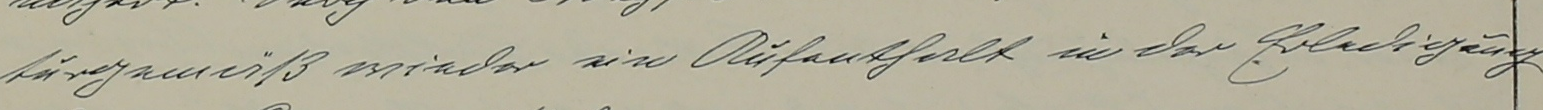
turgemäß wieder ein Aufenthalt in der Erledigung
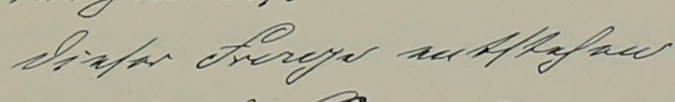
dieser Frage entstehen.
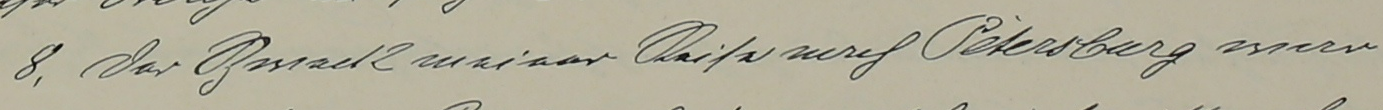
8. Der Zweck meiner Reise nach Petersburg war
